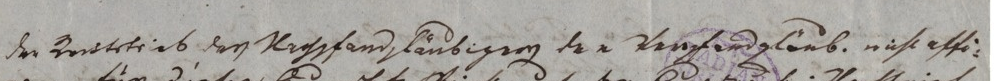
der Rechtstrieb des Nachpfandgläubigers den Vorpfandgläub. nicht affi-
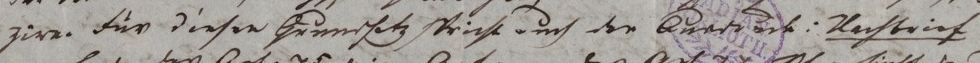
zire. Für diesen Grundsatz spricht auch der Ausdruck: Nachbrief
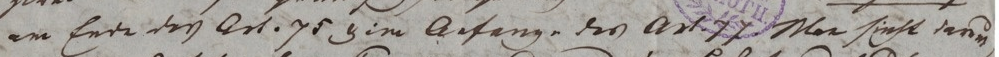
am Ende des Art. 75 & im Anfange des Art. 77. Man sieht daraus,
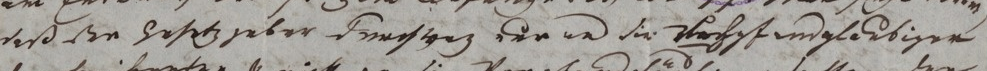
daß der Gesetzgeber durchweg nur an die Nachpfandgläubiger
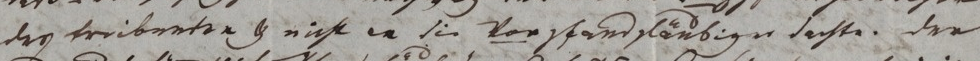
des Triebanten & nicht an die Vorpfandgläubiger dachte. Der
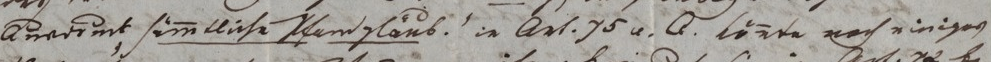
Ausdruck sämmtliche Pfandgläub. in Art. 75a könnte noch einiges
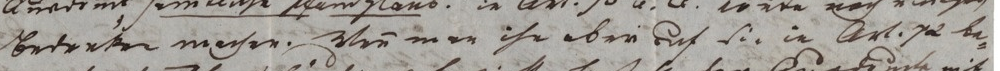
Bedenken machen. Wenn man ihn aber auf die in Art. 72 be-
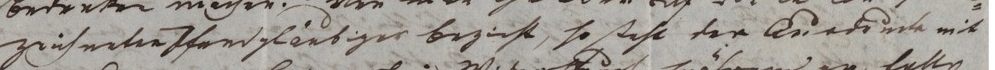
zeichneten Pfandgläubiger bezieht, so steht der Ausdruck mit
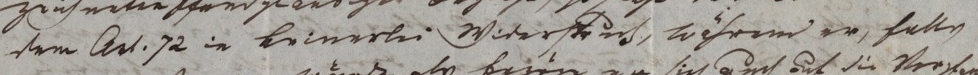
dem Art. 72 in keinerlei Widerspruch, während er, falls
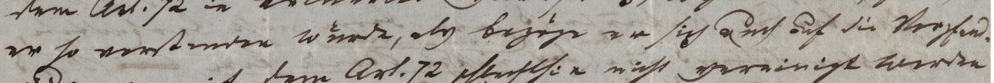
er so verstanden würde, als bezöge er sich auch auf die Vorpfand-
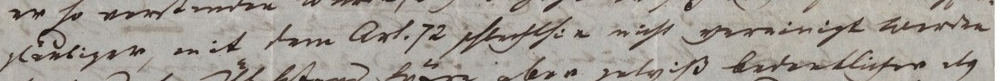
gläubiger, mit dem Art. 72 schlechthin nicht vereinigt werden
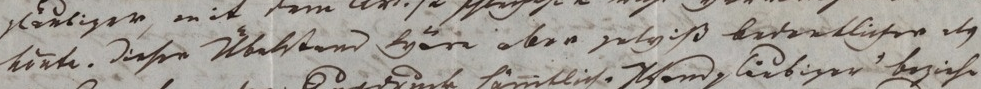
könnte. Dieser Übelstand wäre aber gewiß bedenklicher als
